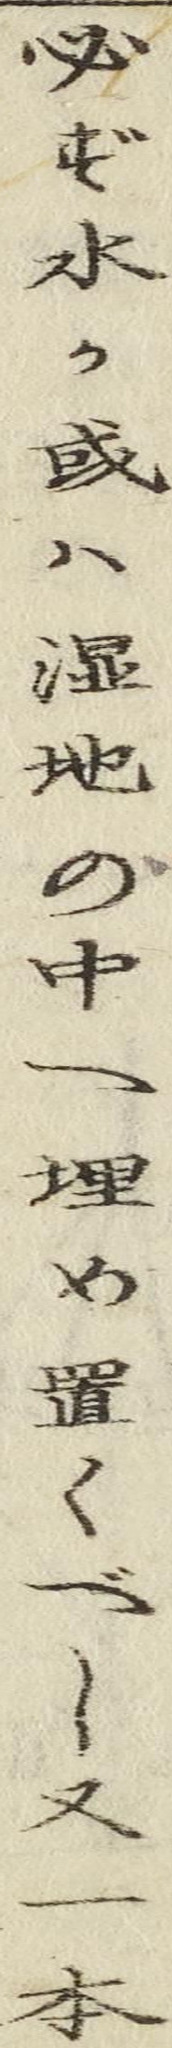必ず水か或は湿地の中へ埋め置くべし又一本
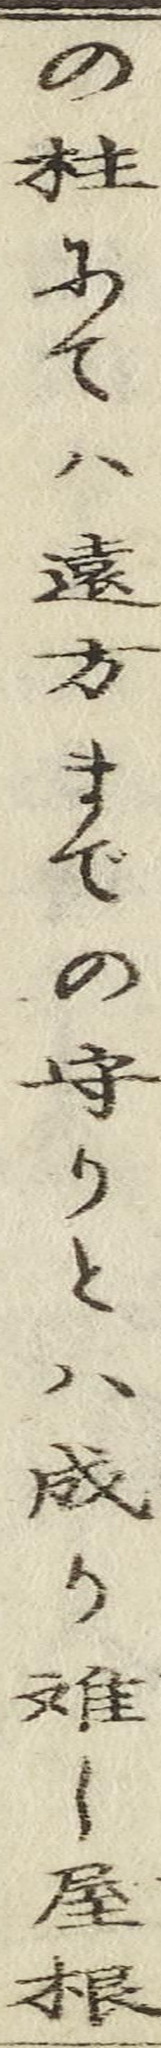の柱にては遠方までの守りとは成り難し屋根
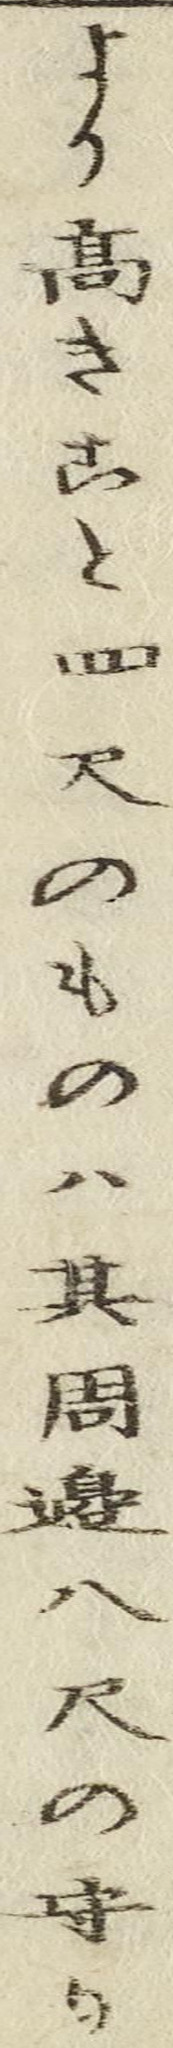より高きこと四尺のものは其周辺八尺の守り
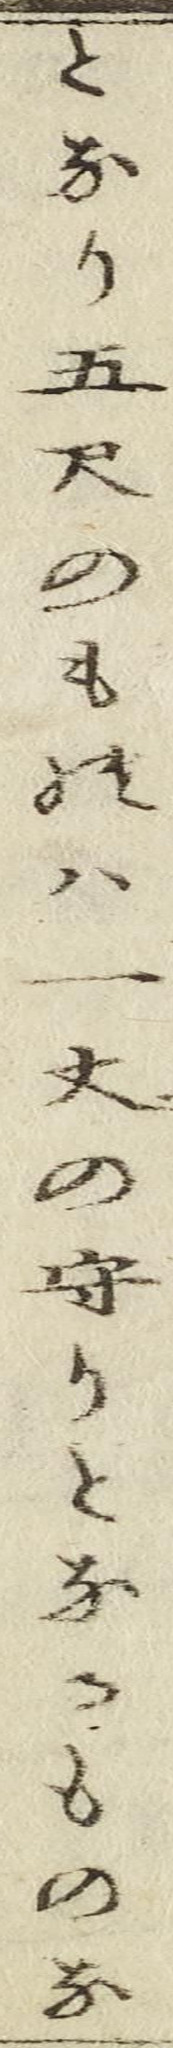となり五尺のものは一丈の守りとなるものな
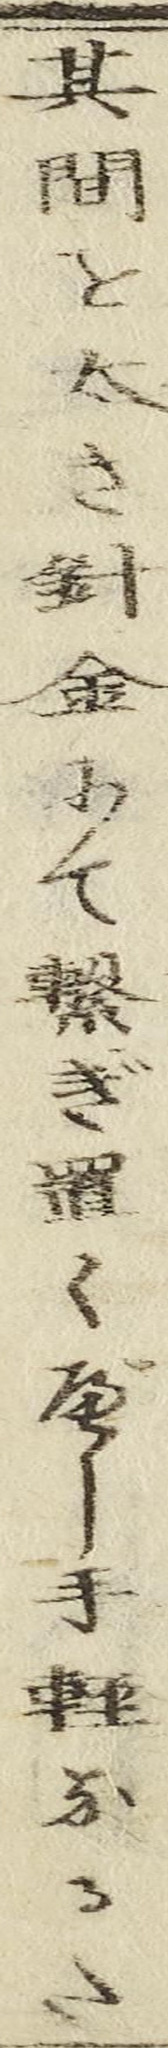其間を太き針金にて繋ぎ置くべし手軽なるた
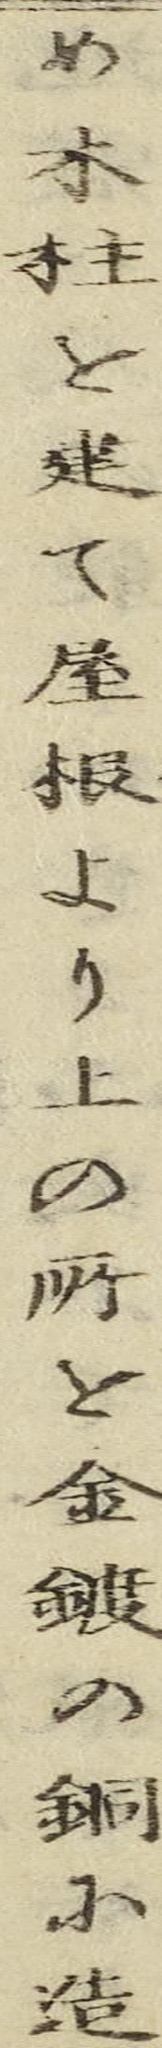め木柱を建て屋根より上の所を金鍍の銅に造
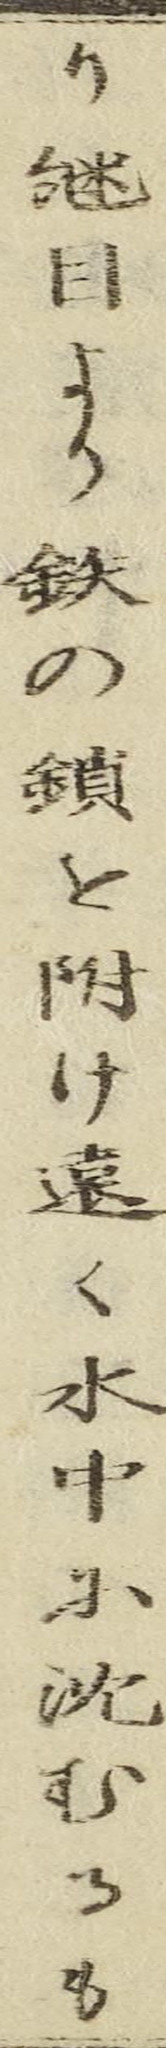り継目より鉄の鎖を附け遠く水中に沈むるも
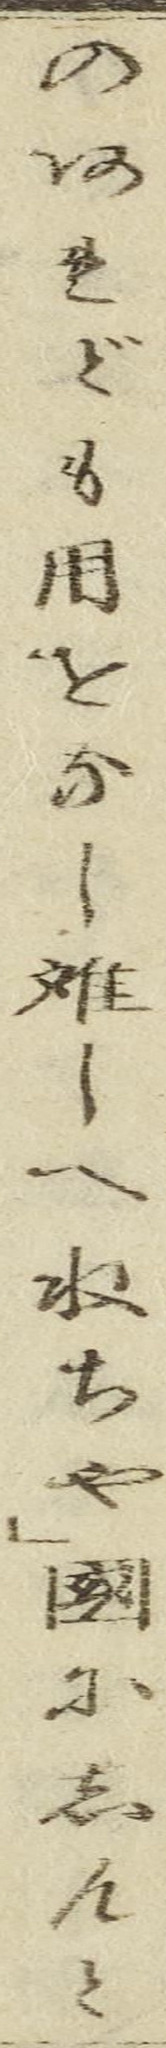のあれども用をなし難し「へねちや」国に「しんと
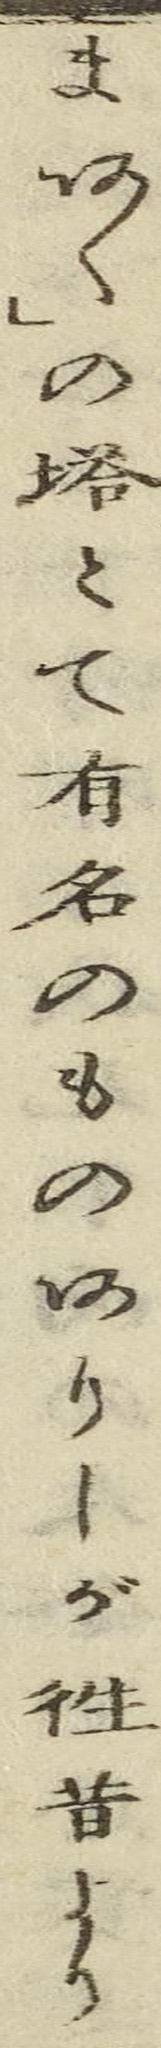まあく」の塔とて有名のものありしが往昔より
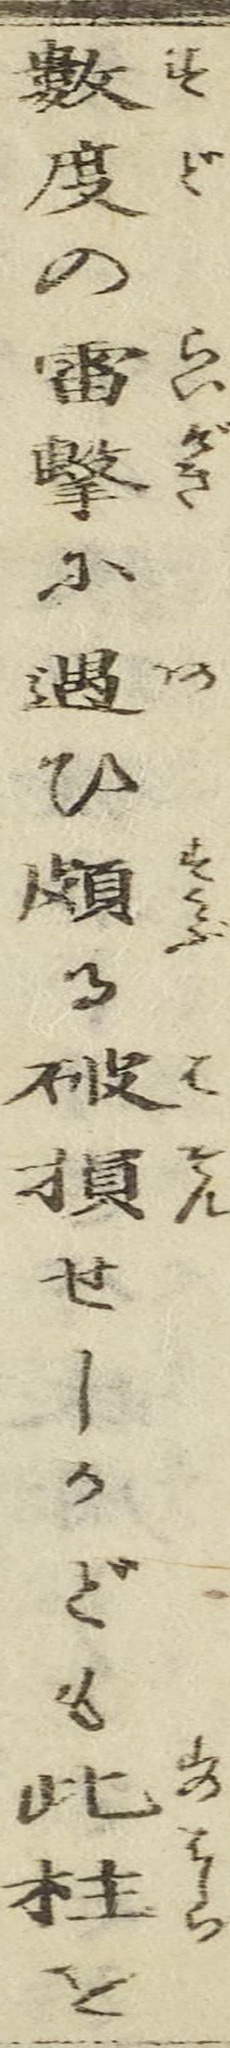数度の雷撃に遇ひ頗る破損せしかども此柱を
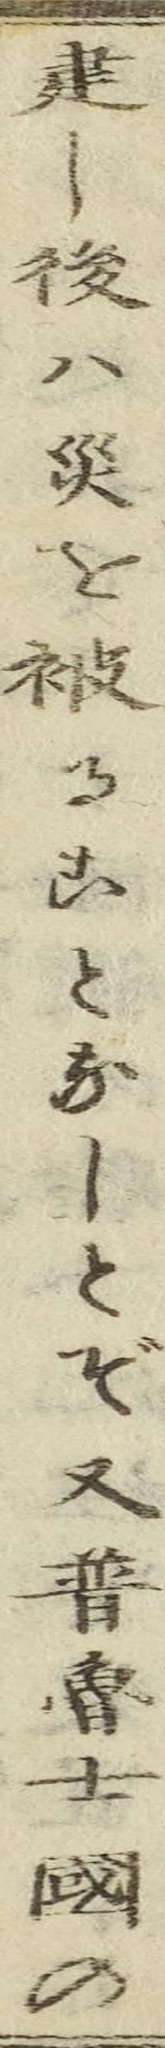建し後は災を被ることなしとぞ又普魯士国の
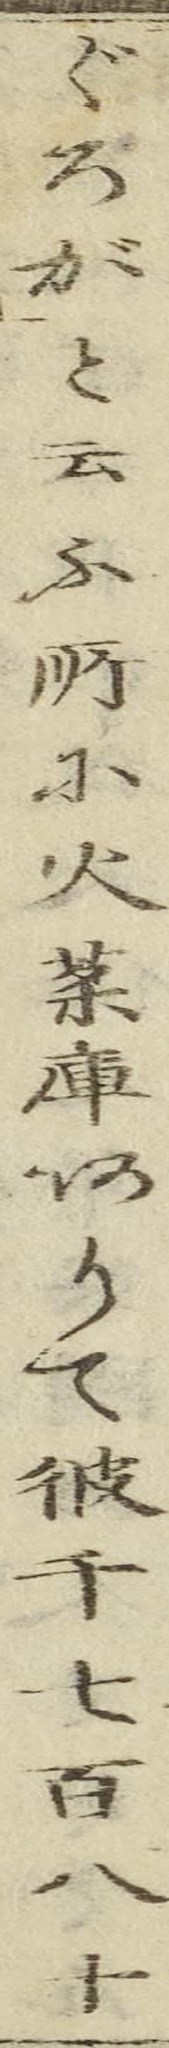「ぐろが」と云ふ所に火薬庫ありて彼千七百八十
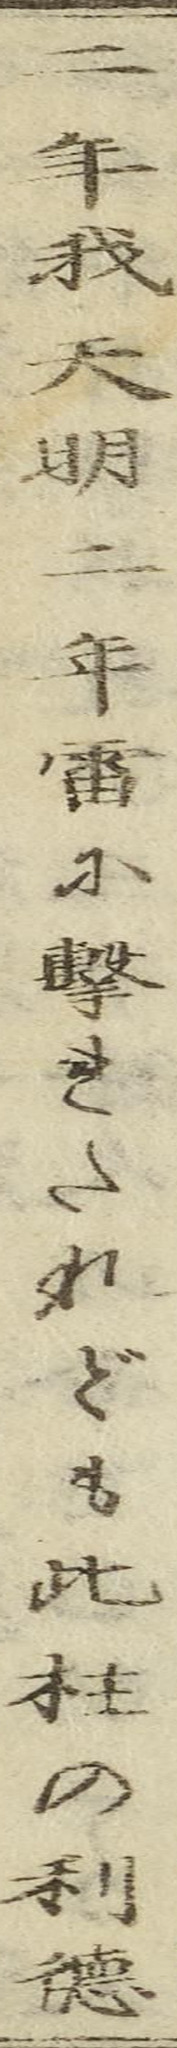二年我天明二年雷に撃れたれども此柱の利徳
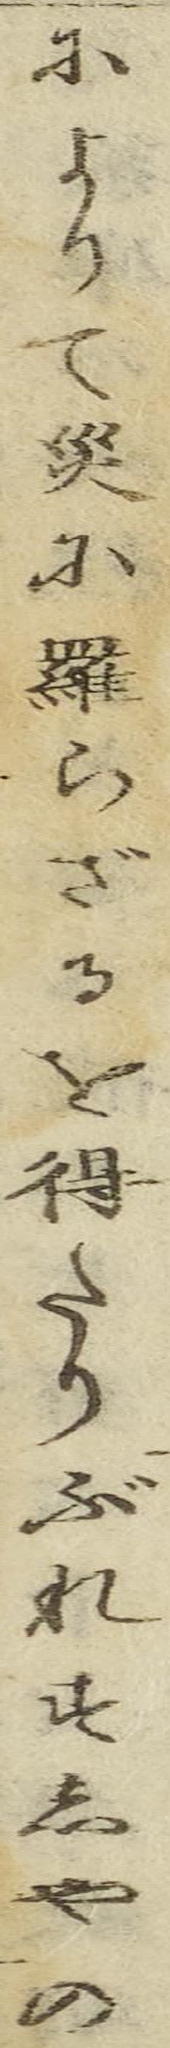によりて災に羅らざるを得たり「ぶれすしや」の

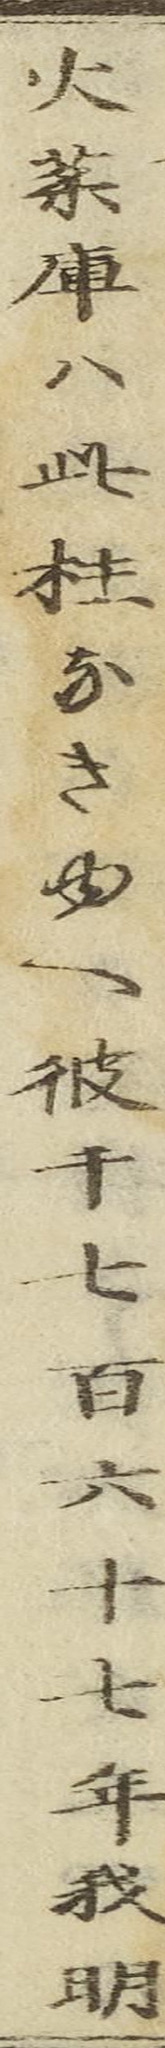火薬庫は此柱なきゆへ彼千七百六十七年我明
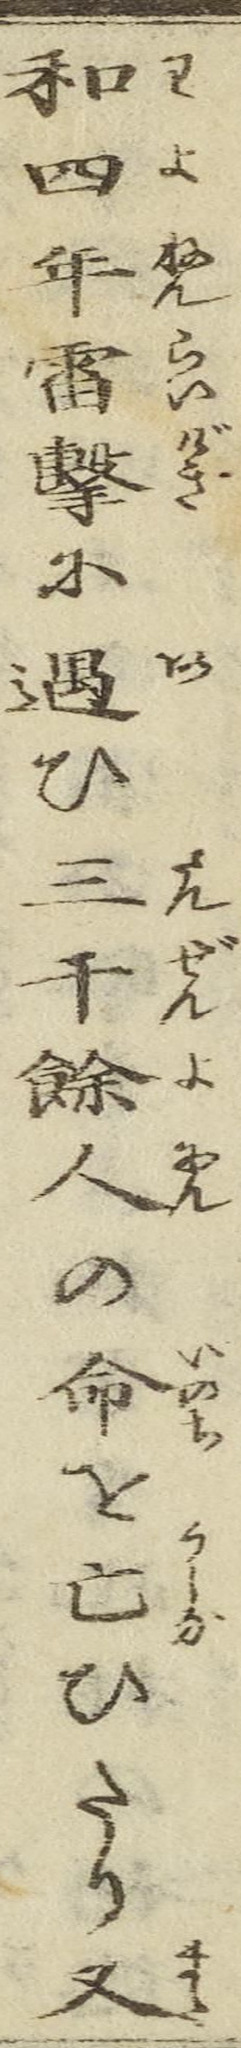和四年雷撃に遇ひ三千余人の命を亡ひたり又
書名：天変地異
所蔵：東京大学地震研究所図書室 Earthquake Research Institute Library, The University of Tokyo, JAPAN
